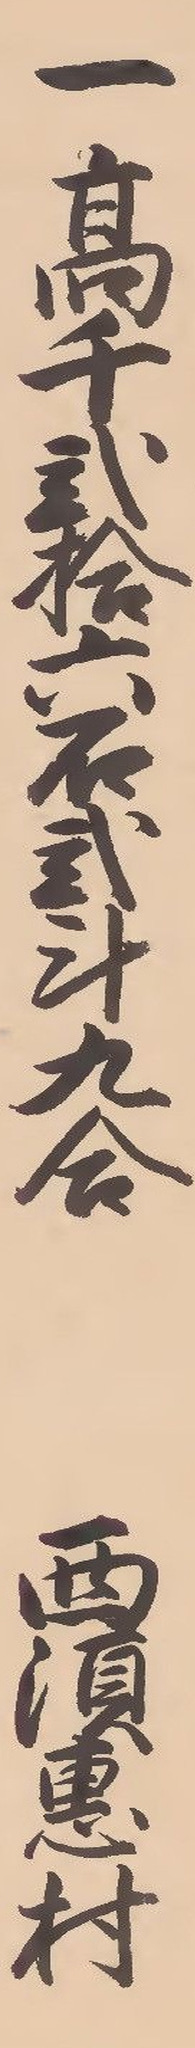一髙千弐拾六石弐斗九合西須恵村
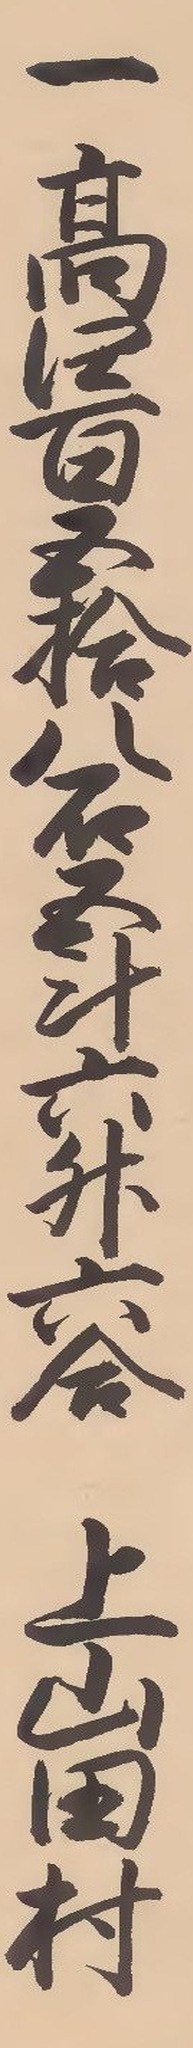一髙四百五拾八石五斗六升六合上山田村
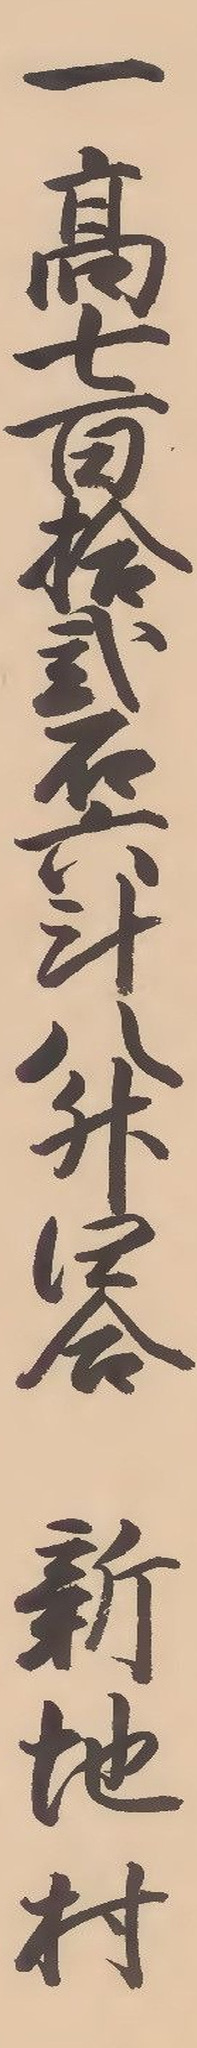一髙七百拾弐石六斗八升四合新地村
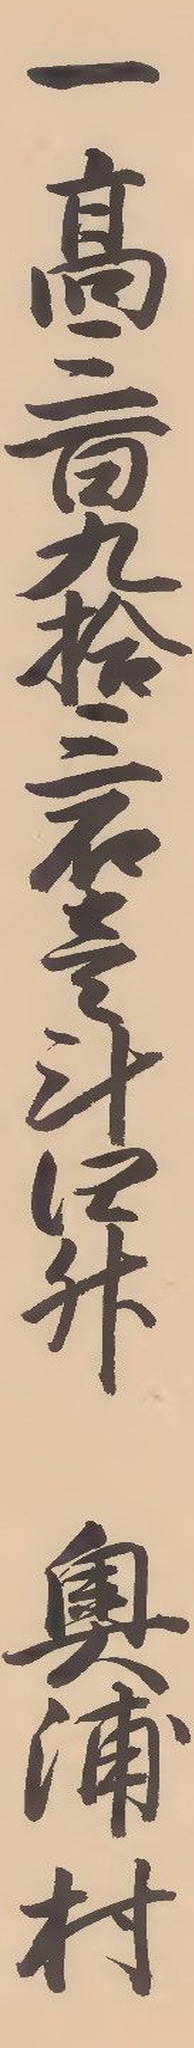一髙三百九拾三石壱斗四升奥浦村
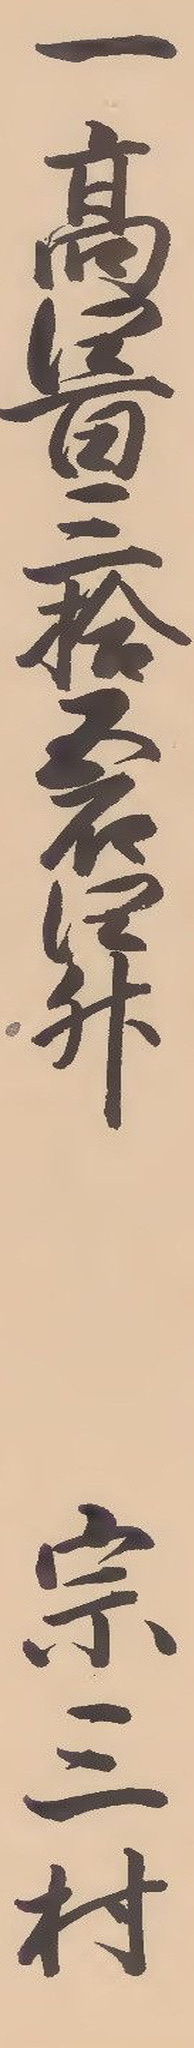一髙四百三拾五石四升宗三村

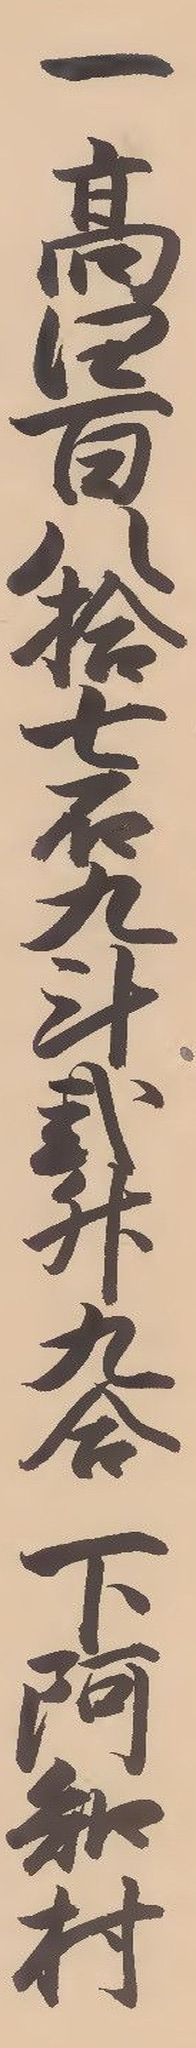一髙四百八拾七石九斗弐升九合下阿知村
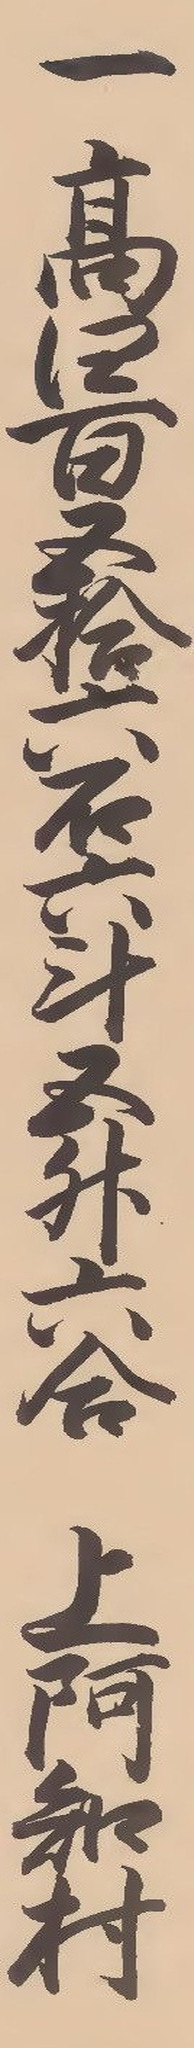一髙四百五拾六石六斗五升六合上阿知村
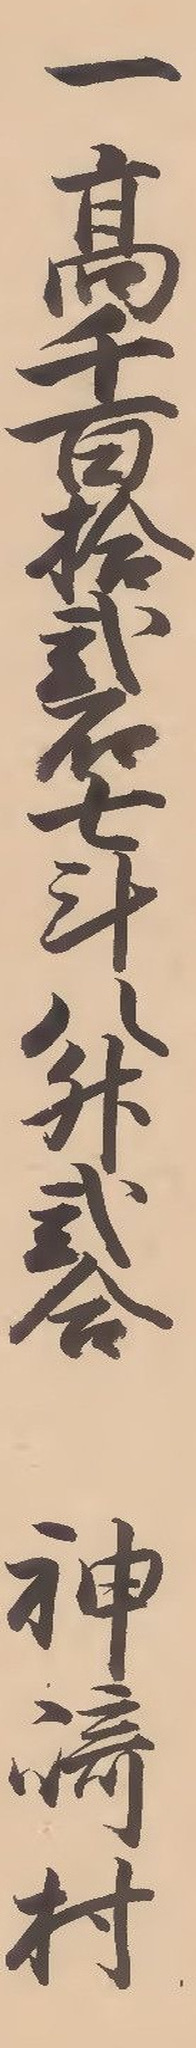一髙千百拾弐石七斗八升弐合神崎村
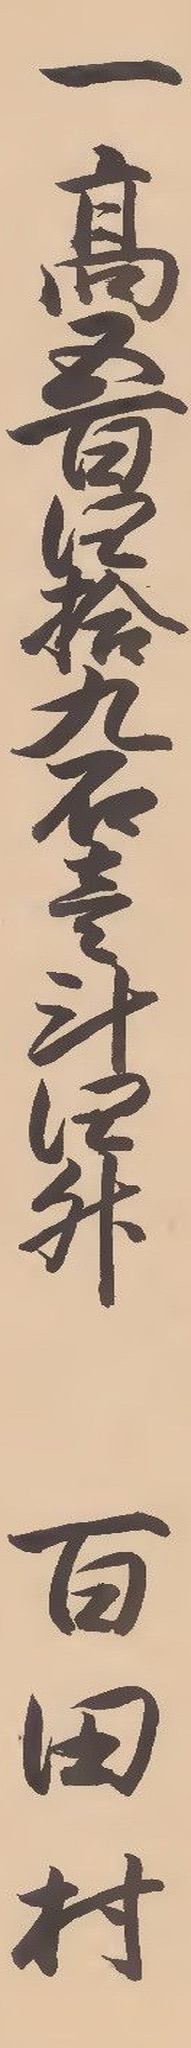一髙五百四拾九石壱斗四升百田村
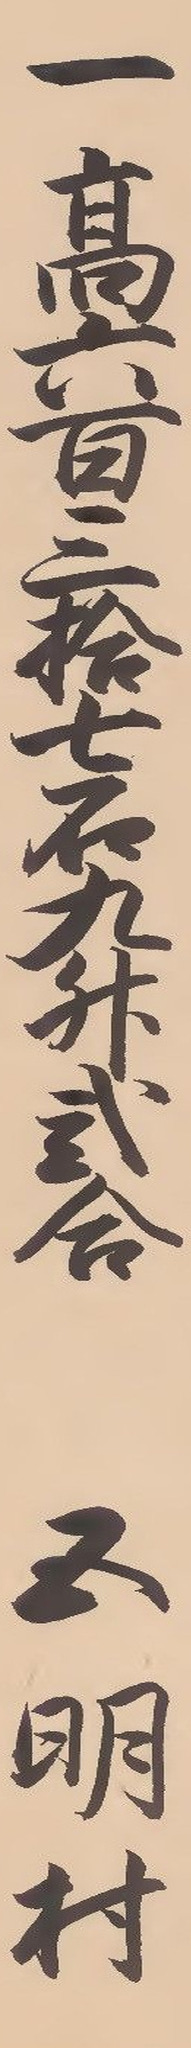一髙六百三拾七石九升弐合五明村
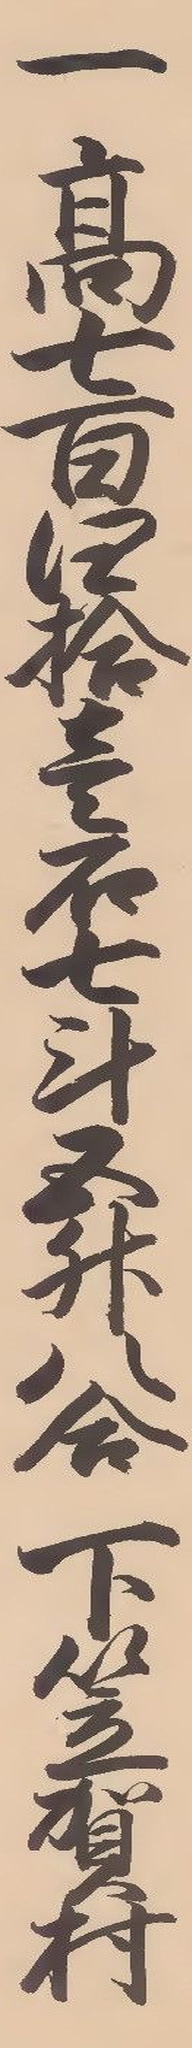一髙七百四拾壱石七斗五升八合下笠賀村
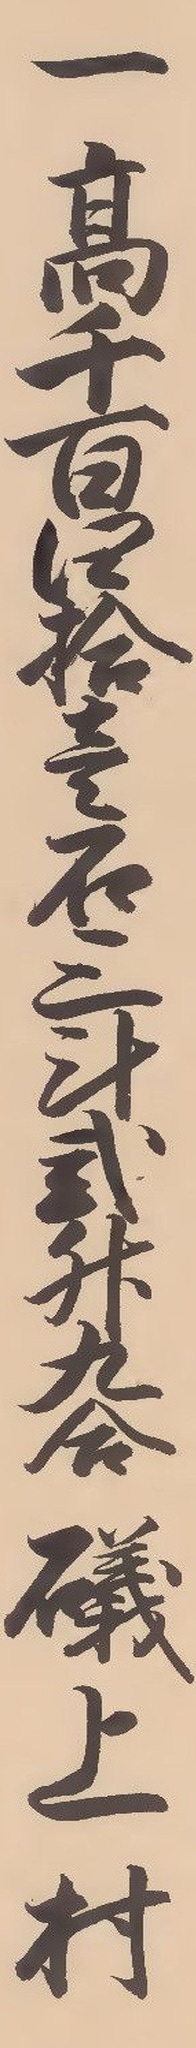一髙千百四拾壱石三斗弐升九合磯上村
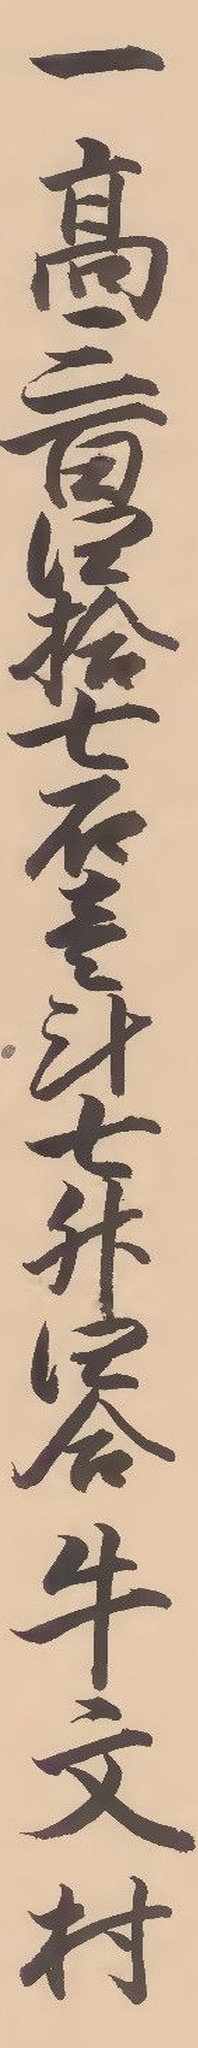一髙三百四拾七石壱斗七升四合牛文村

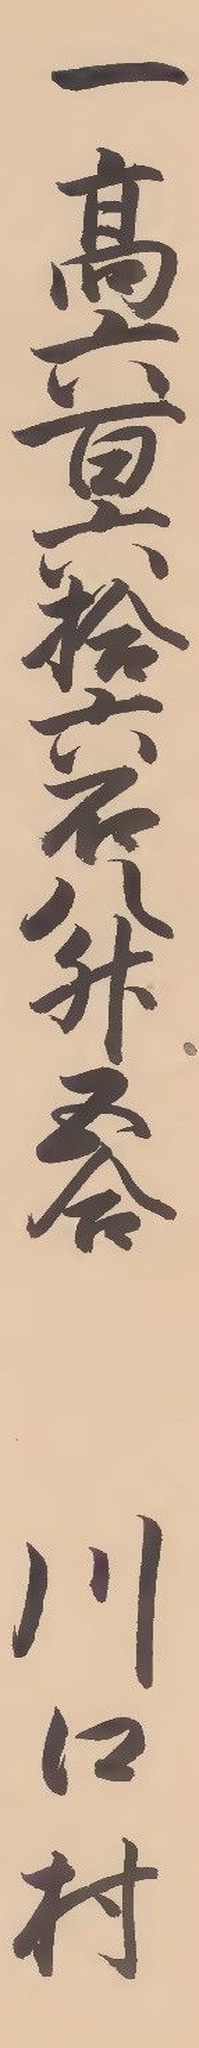一髙六百六拾六石八升五合川口村
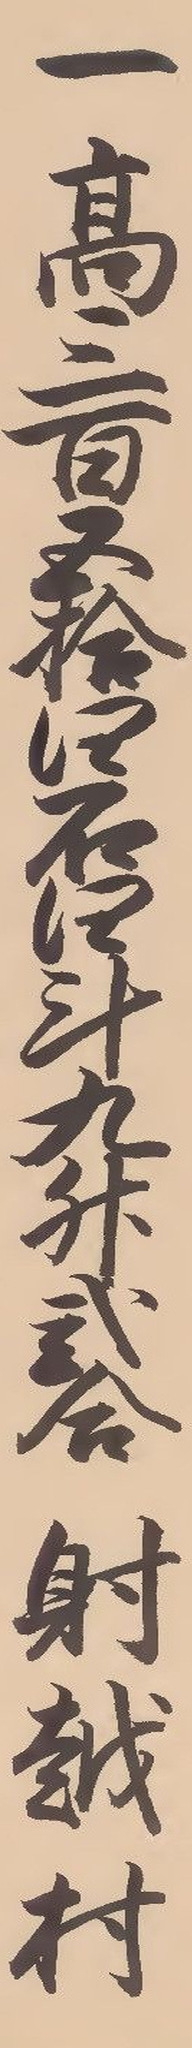一髙三百五拾四石四斗九升弐合射越村
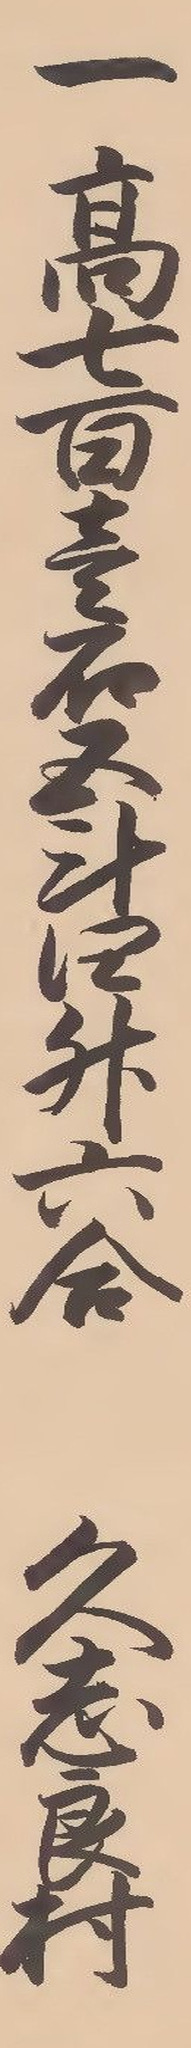一髙七百壱石五斗四升六合久志良村
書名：備前国郷帳
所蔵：国立公文書館 National Archives of Japan
